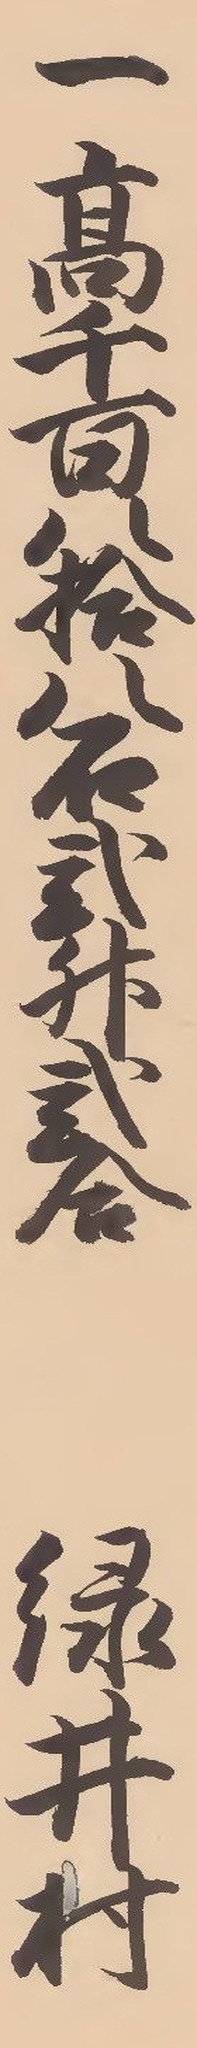一高千百八拾八石弐升弐合緑井村
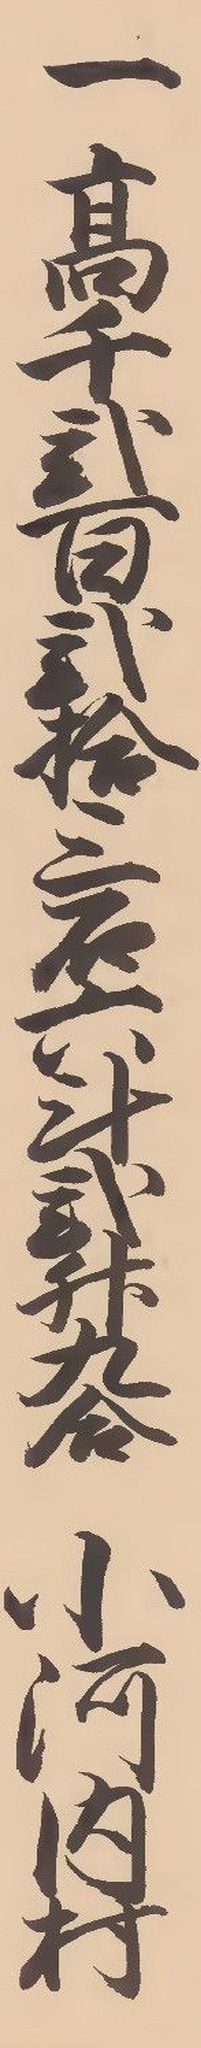一高千弐百弐拾三石六斗弐升九合小河内村
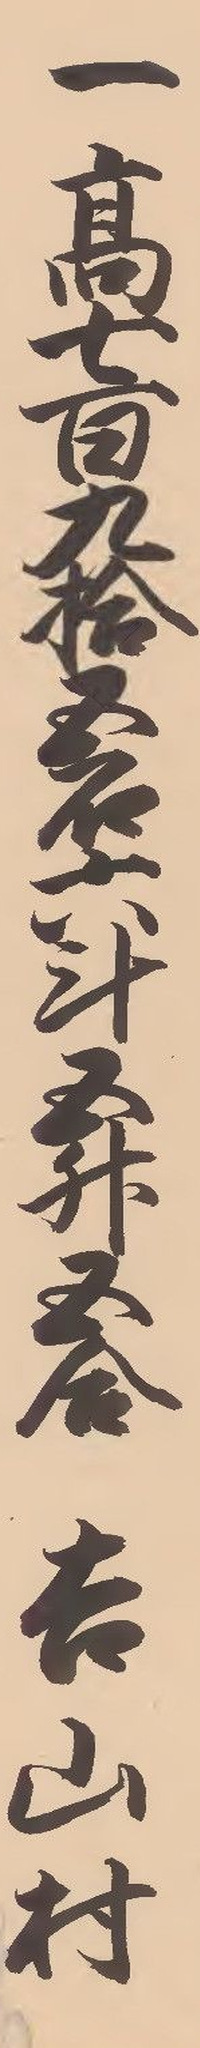一高七百九拾五石六斗五升五合吉山村
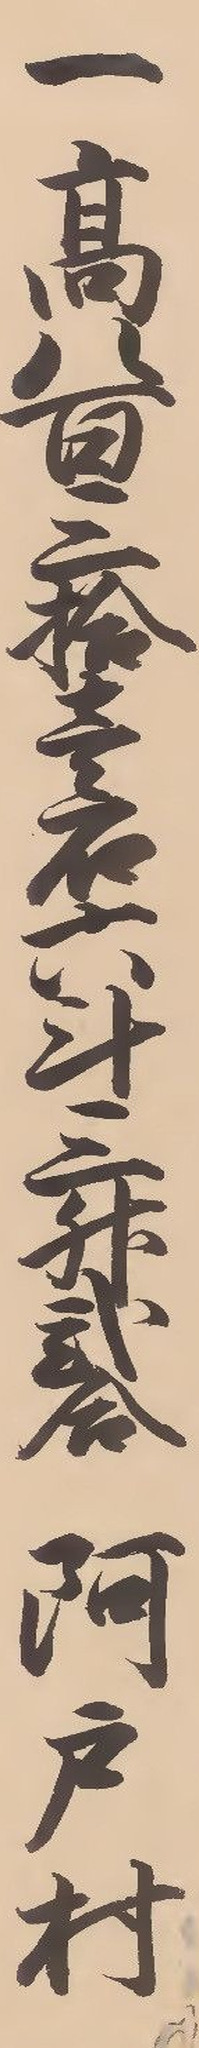一高八百三拾壱石六斗三升弐合阿戸村
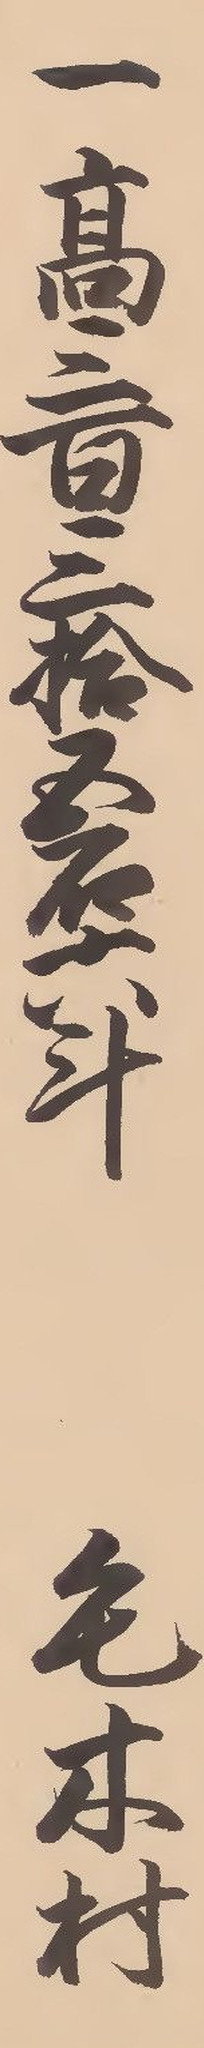一高三百三拾五石六斗毛木村
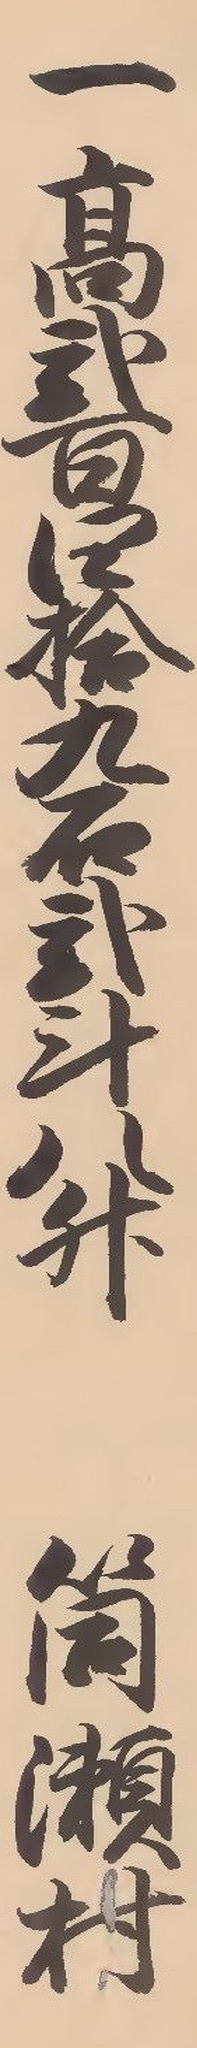一高弐百四拾九石弐斗八升筒瀬村
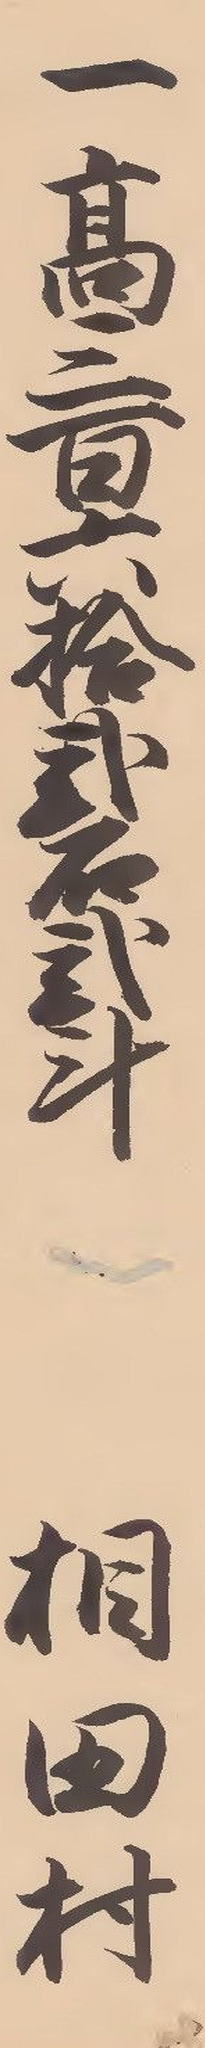一高三百六拾弐石弐斗相田村

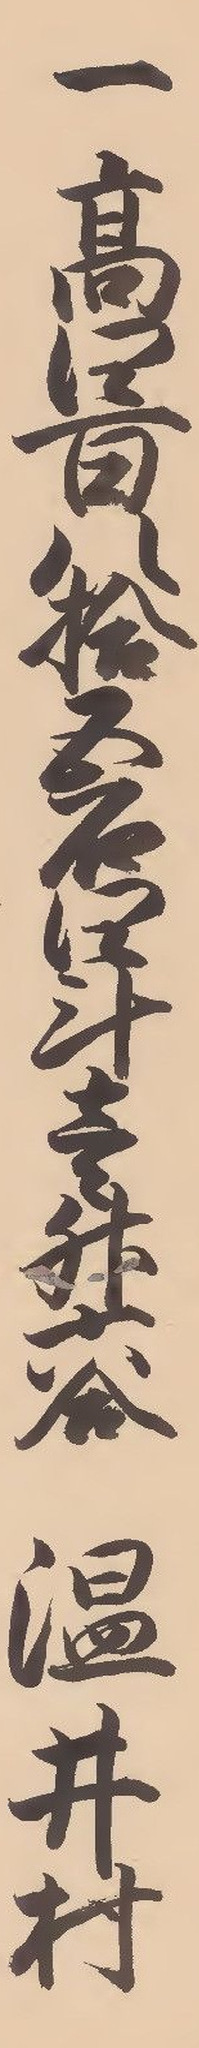一高四百八拾五石四斗壱升六合温井村
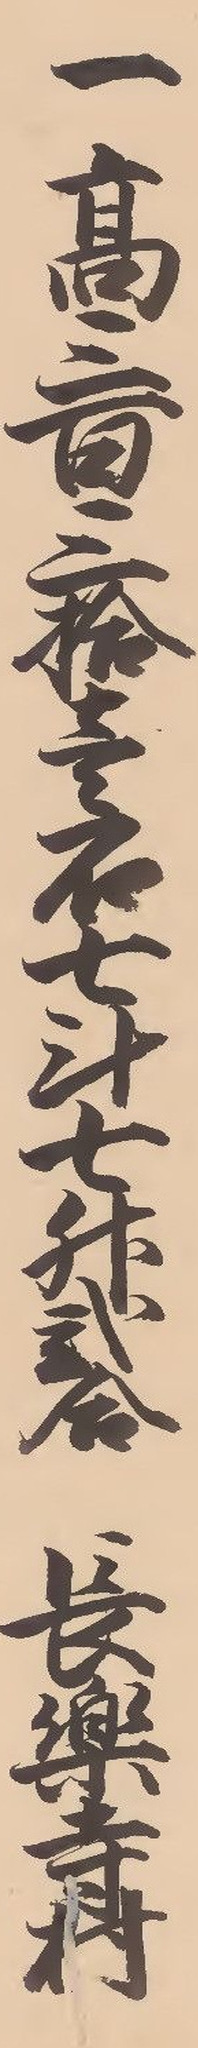一高三百三拾壱石七斗七升弐合長楽寺村
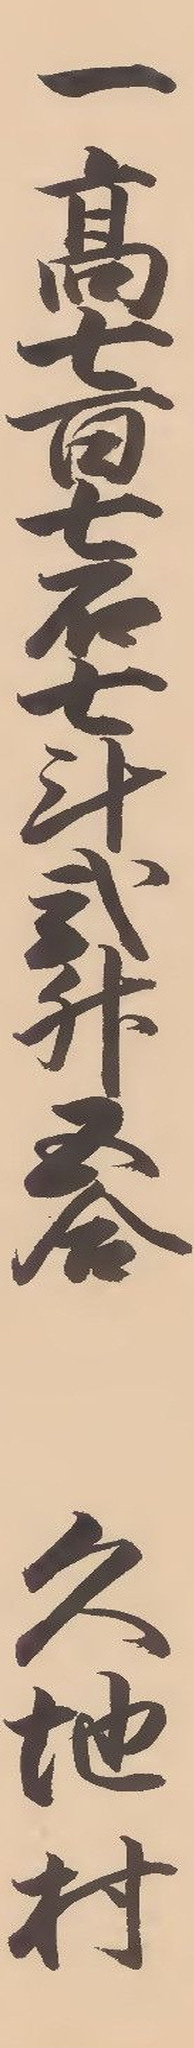一高七百七石七斗弐升五合久地村
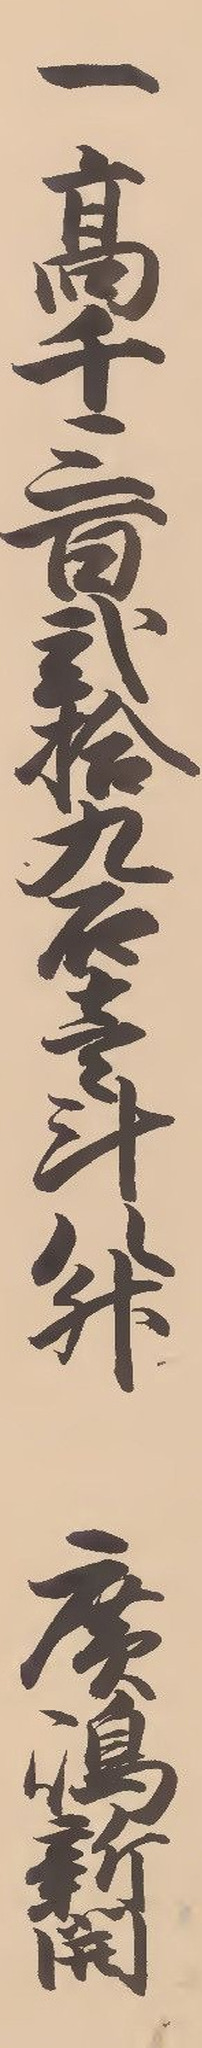一高千三百弐拾九石壱斗八升広島新開
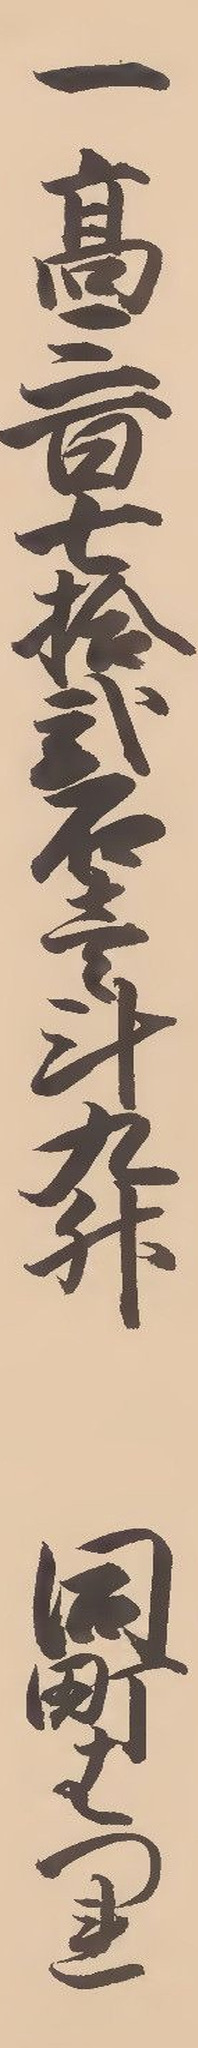一高三百七拾弐石壱斗九升同町はつれ
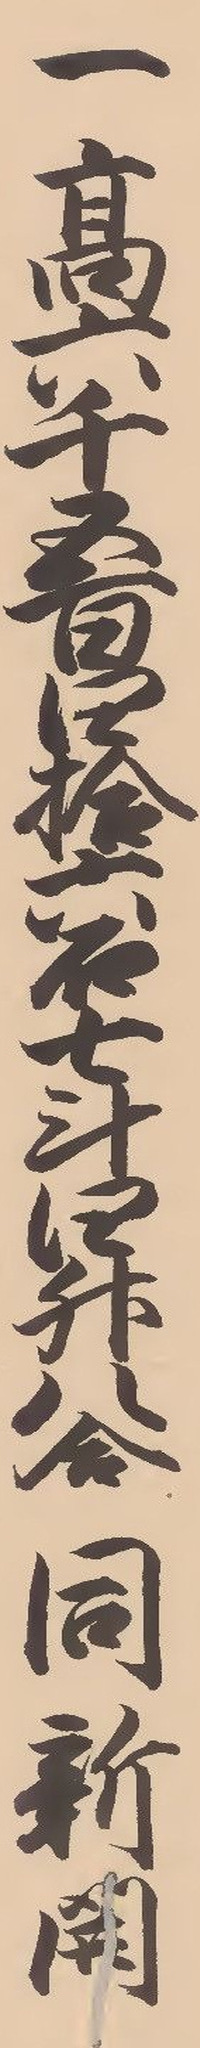一高六千五百四拾六石七斗四升八合同新開
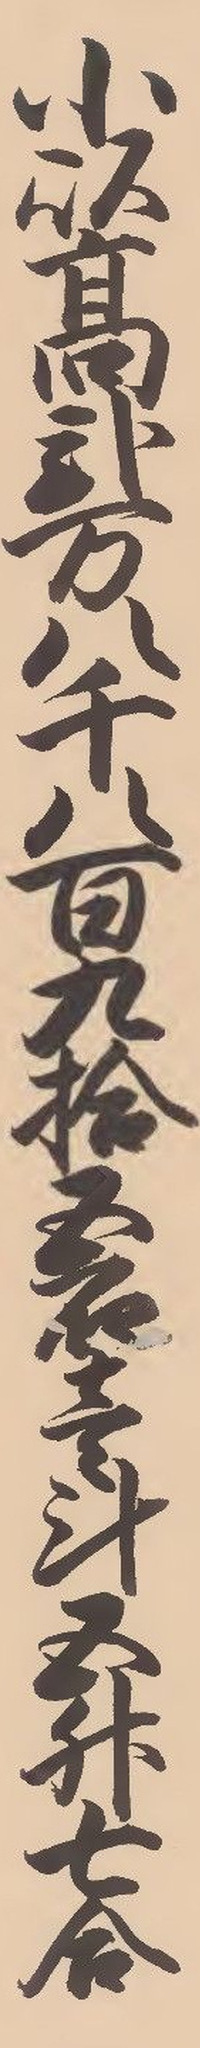小以高弐万八千八百九拾五石壱斗五升七合

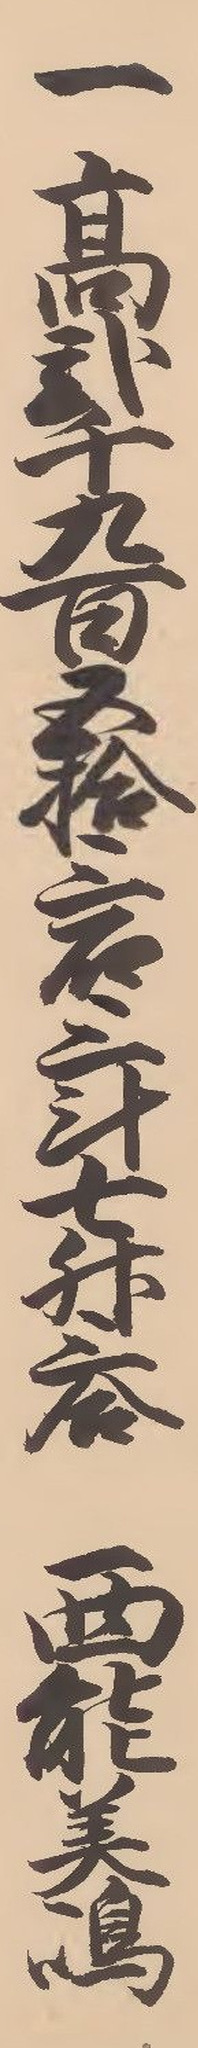一高弐千九百五拾三石三斗七升三合西能美島
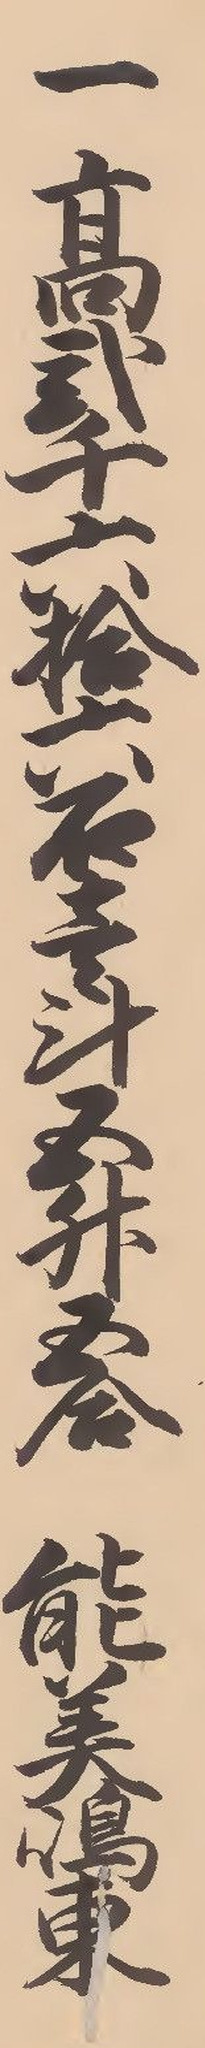一高弐千六拾六石壱斗五升五合能美島東
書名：安芸国郷帳
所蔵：国立公文書館 National Archives of Japan
